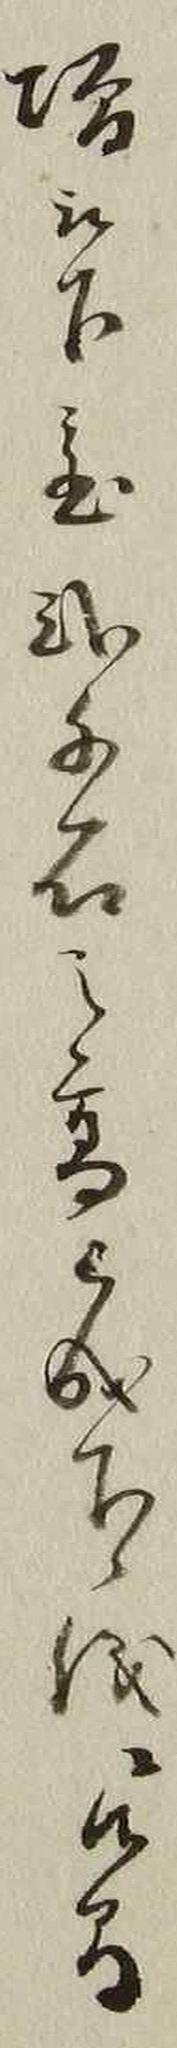増被下置弐千石之高被成下候儀に候間
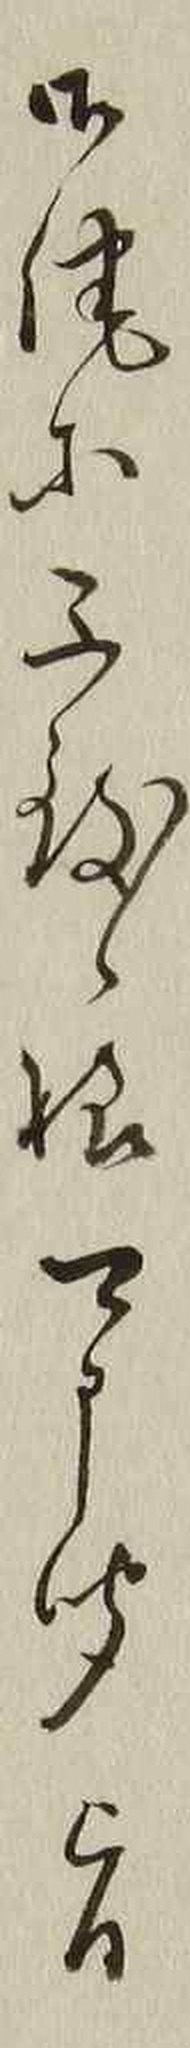御詫不致候様可申聞旨
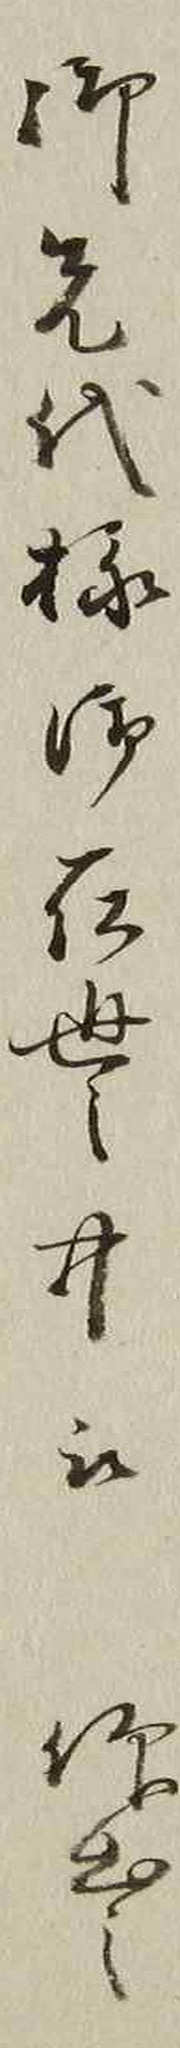御先代様御在世之中被仰出之
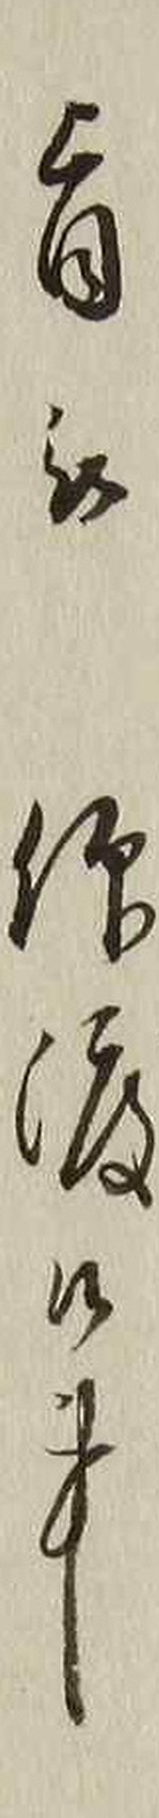旨被仰渡候事
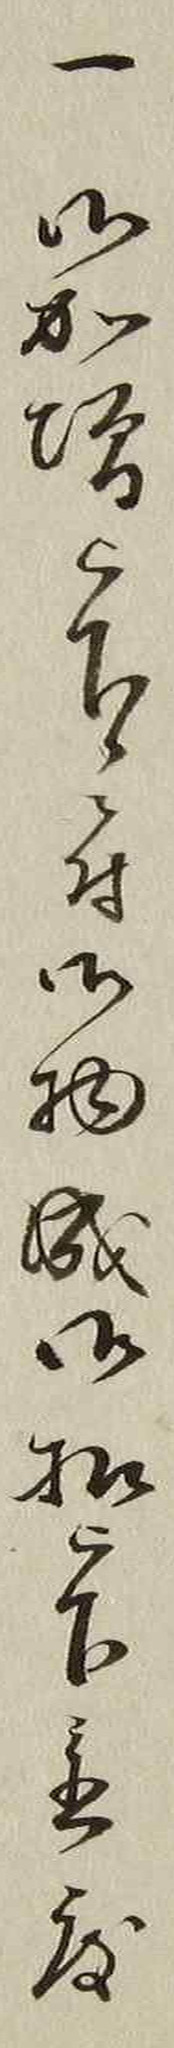一御加増被下候に付御物成御扣被下置度
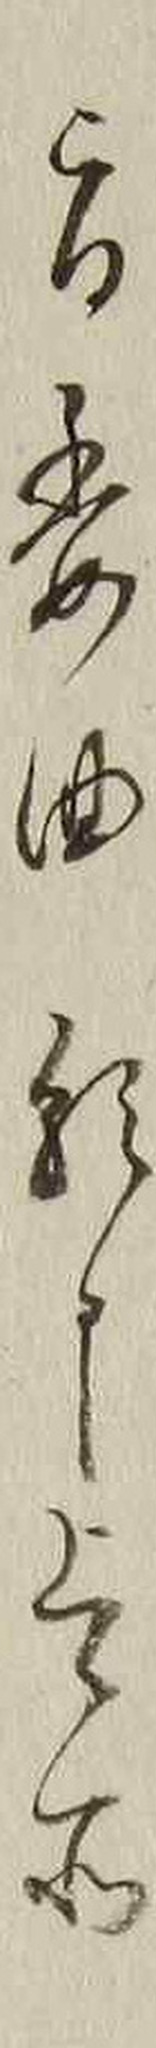旨委曲願申上候所
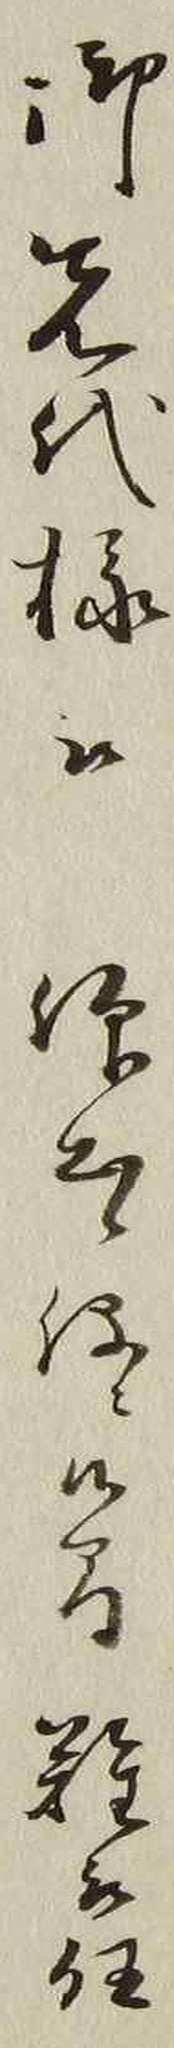御先代様被仰出候儀に候間難被任
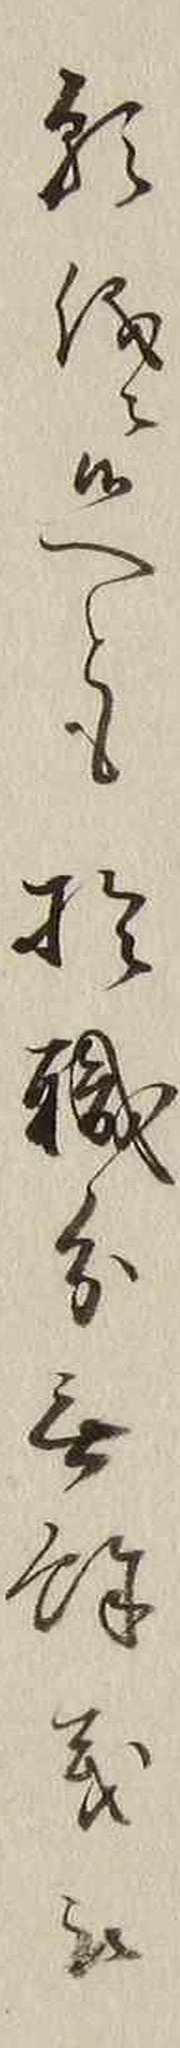願儀に候へとも於職分無餘義被
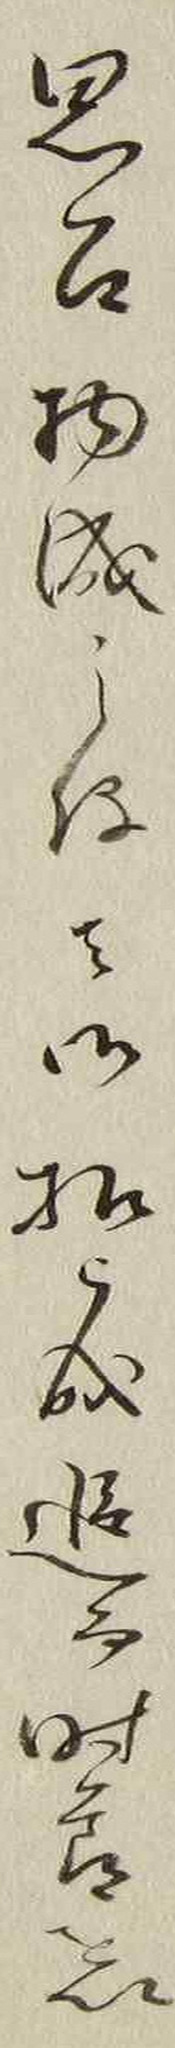思召物成之儀は御扣被成追而時節を以
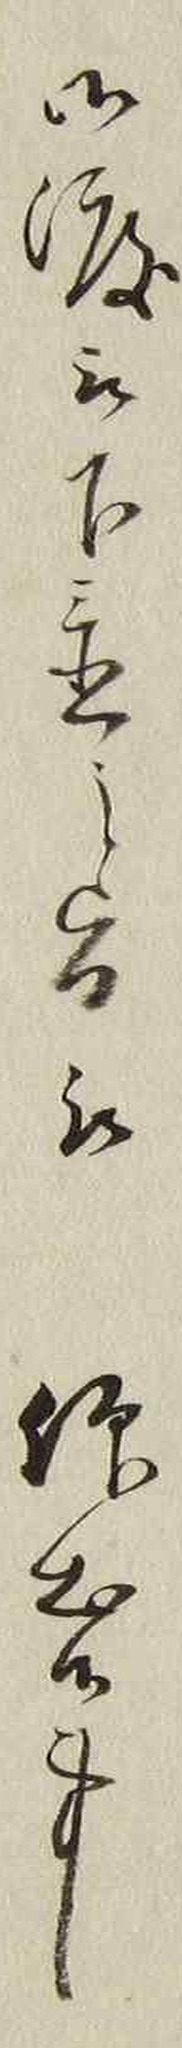御渡被下置之旨被仰出候事
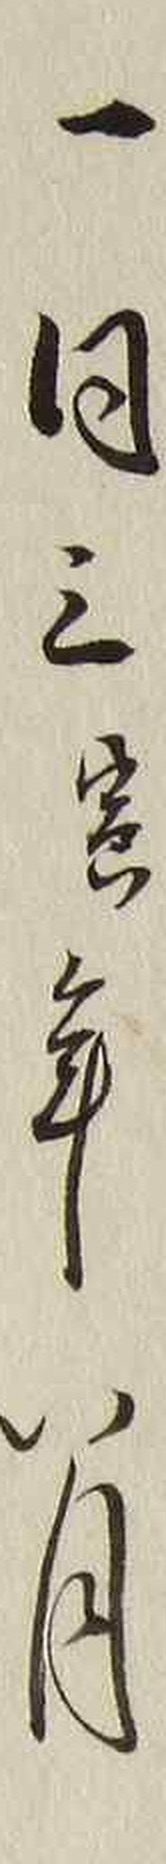一同三寅年八月
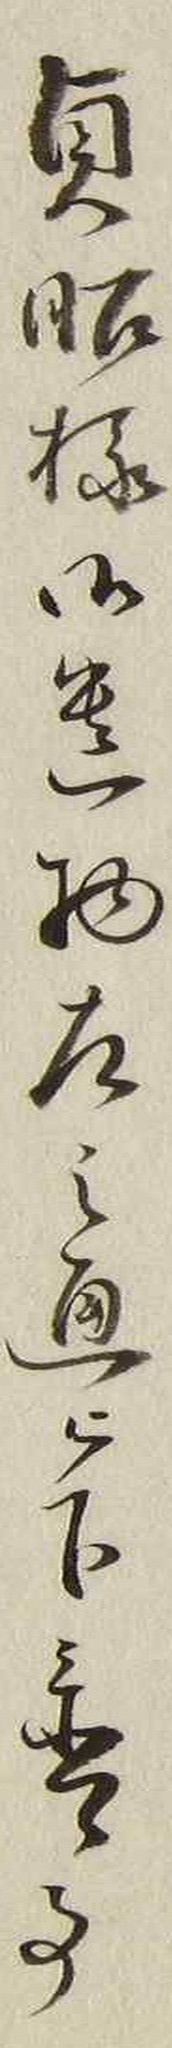貞昭様御遺物左之通被下置候事
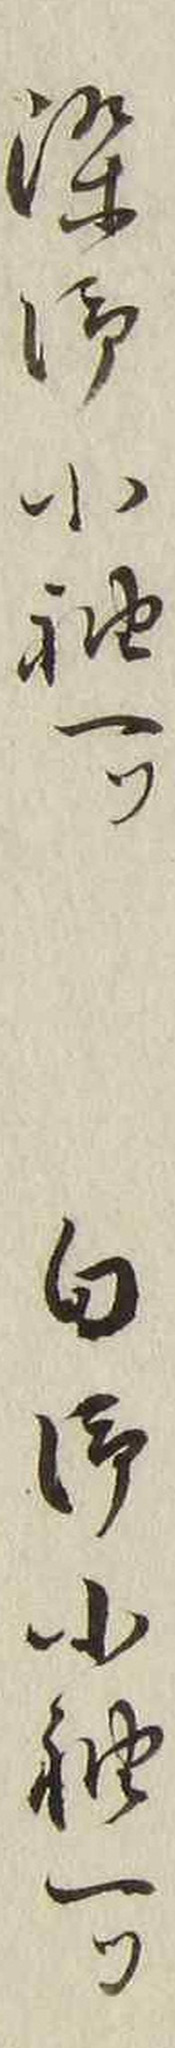染御小袖一つ白御小袖一つ

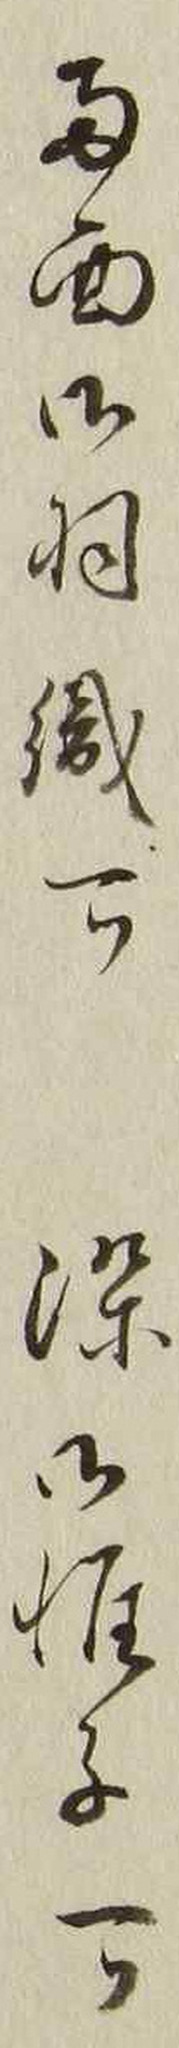両面御羽織一染御帷子一つ
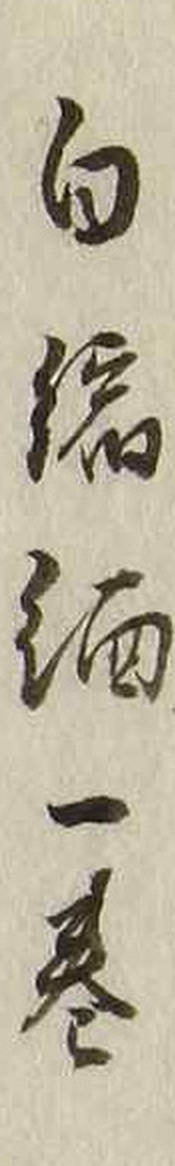白縮緬一巻
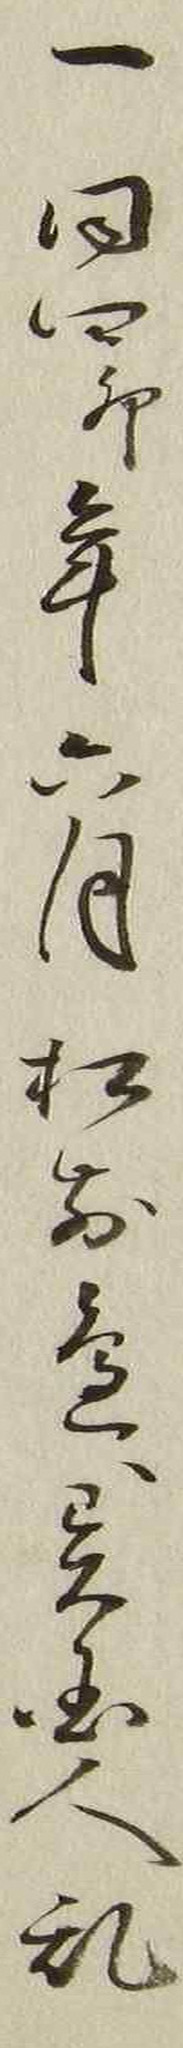一同四卯年六月松前辺に異国人乱
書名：諸士系譜　巻之159　な之部1
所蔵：会津若松市立会津図書館
